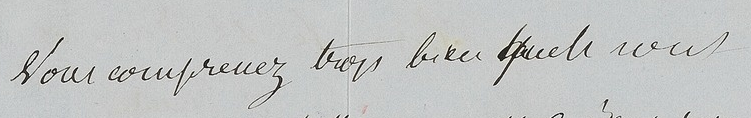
Vous comprenez trop bien quels sont
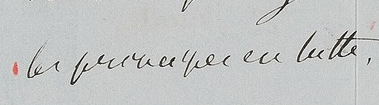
les principes en lutte,
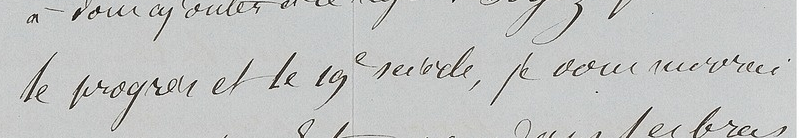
le progrès et le 19e siècle, je vous suivrai
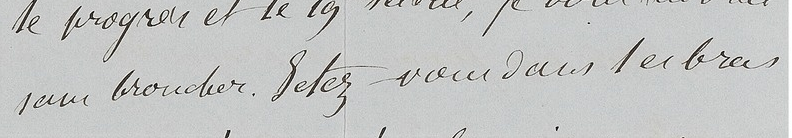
sans broncher. Jetez-vous dans les bras
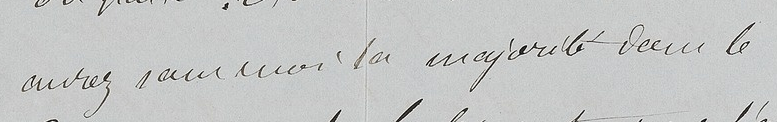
aurez sans moi la majorité dans le
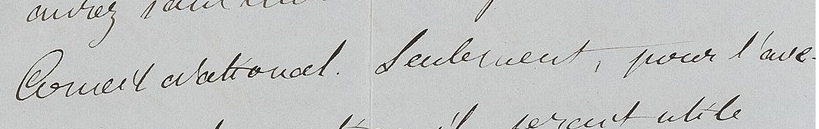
Conseil National. Seulement, pour l'ave-
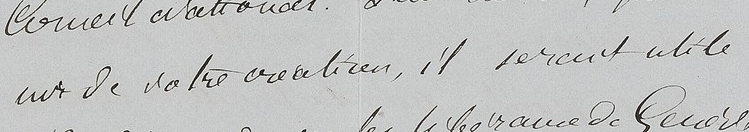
nir de votre création, il serait utile
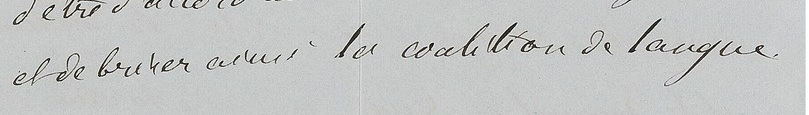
et de briser ainsi la coalition de langue.
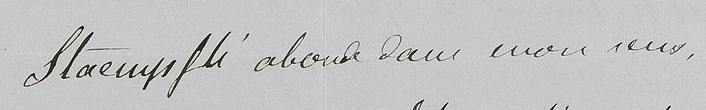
Staempfli abonde dans mon sens.
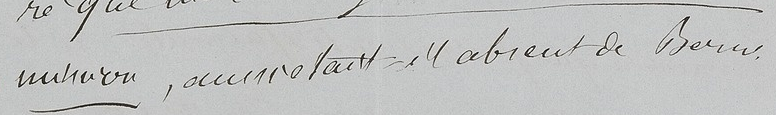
mission, aussi était-il absent de Berne.
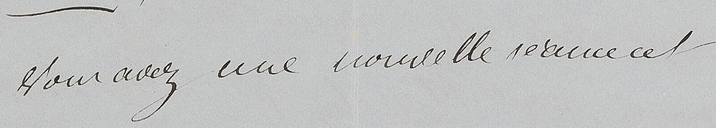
Vous avez une nouvelle séance cet
